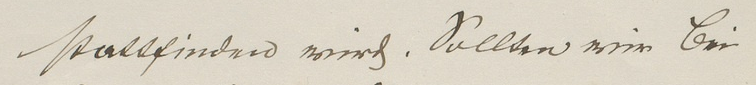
stattfinden wird. Sollten wir bei
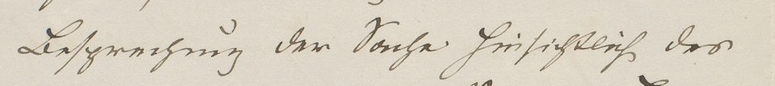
Besprechung der Sache hinsichtlich des
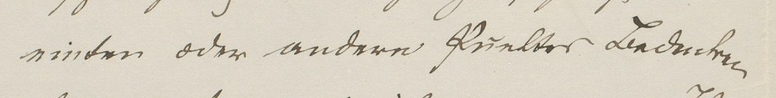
einten oder andern Punktes Bedenken
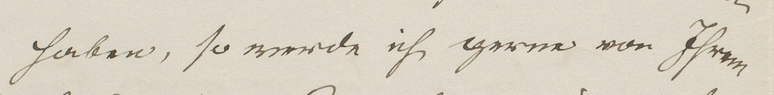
haben, so werde ich gerne von Ihrem
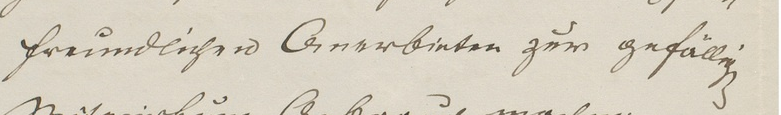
freundlichen Anerbieten zur gefälligen
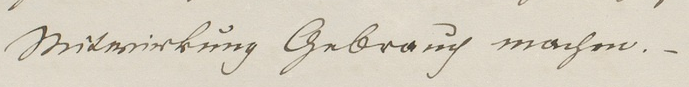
Mitwirkung Gebrauch machen. –
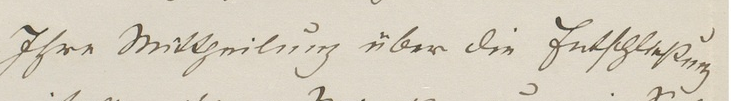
Ihre Mittheilung über die Entschließung
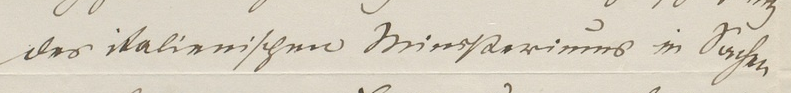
des italienischen Ministeriums in Sachen
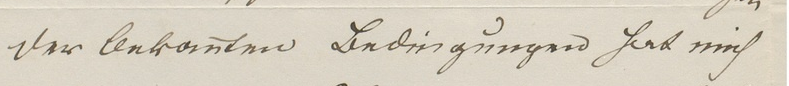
der bekannten Bedingungen hat mich
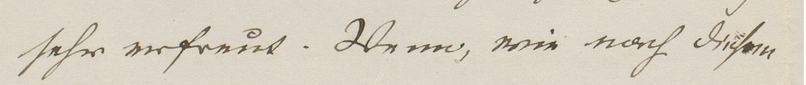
sehr erfreut. Wenn, wie nach diesem
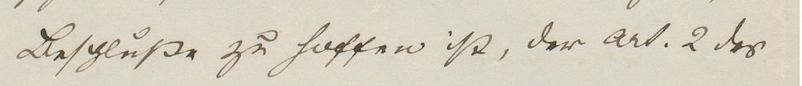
Beschluße zu hoffen ist, der Art. 2 des
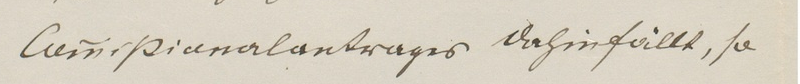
Commißionalantrages dahinfällt, so
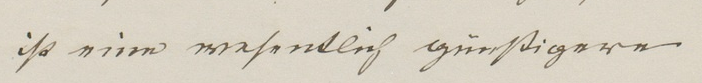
ist eine wesentlich günstigere
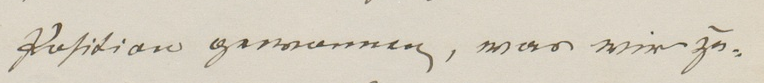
Position gewonnen, was wir zu-
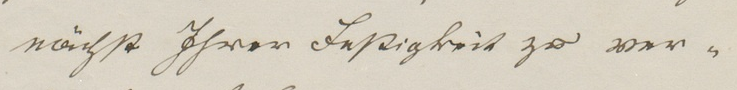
nächst Ihrer Festigkeit zu ver-
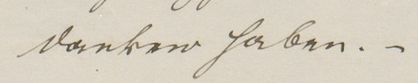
danken haben. –
